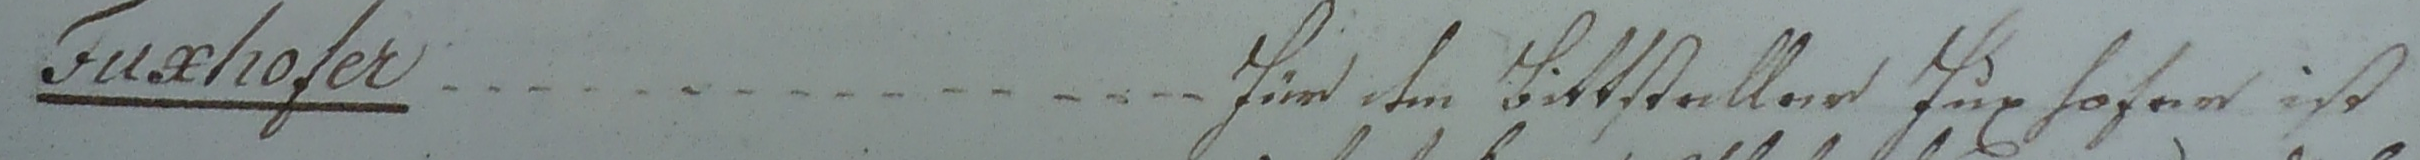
Fuxhofer ……………. Für den Bittsteller Fuxhofer ist
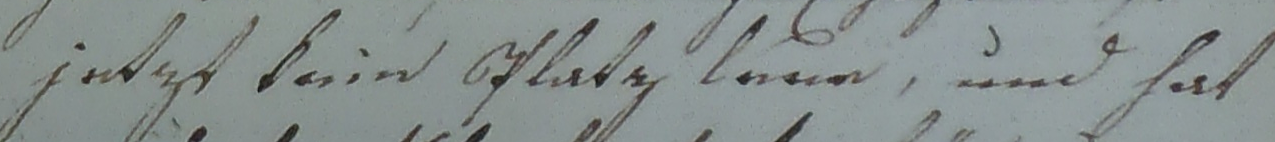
jetzt kein Platz leer, und hat
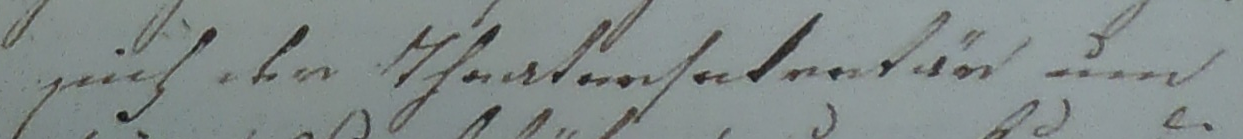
sich der Theatersekretär um
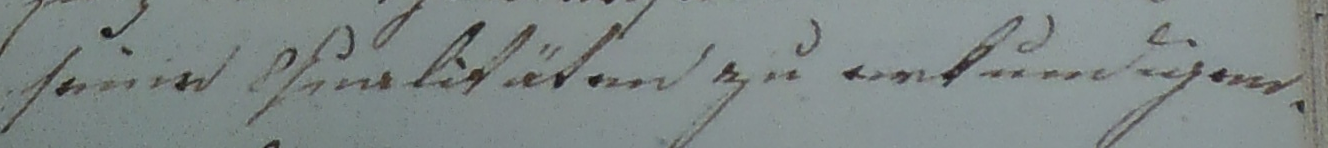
seine Qualitäten zu erkundigen.
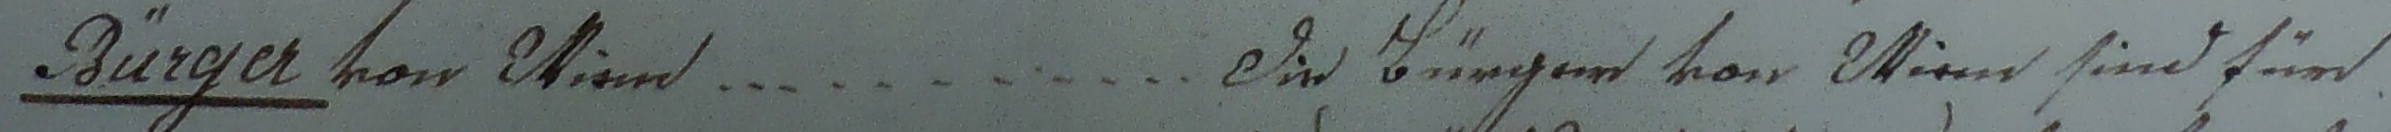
Bürger von Wien ………… Die Bürger von Wien sind für
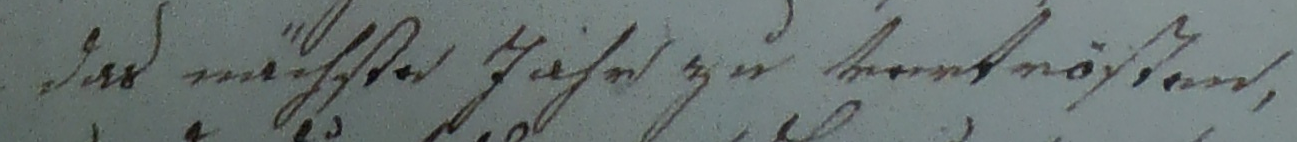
das nächste Jahr zu vertrösten,
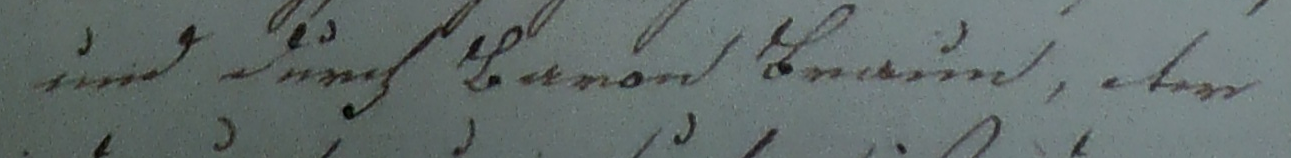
und durch Baron Braun, der
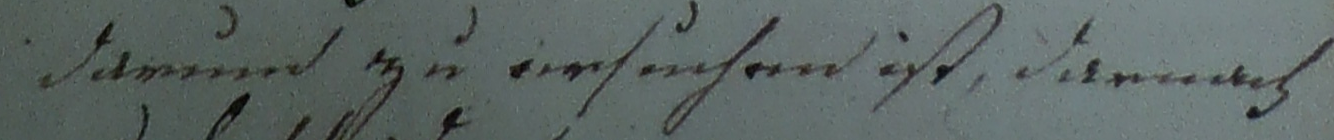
darum zu ersuchen ist, danach
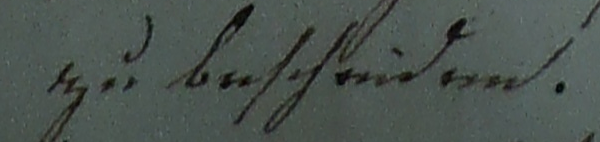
zu bescheiden.
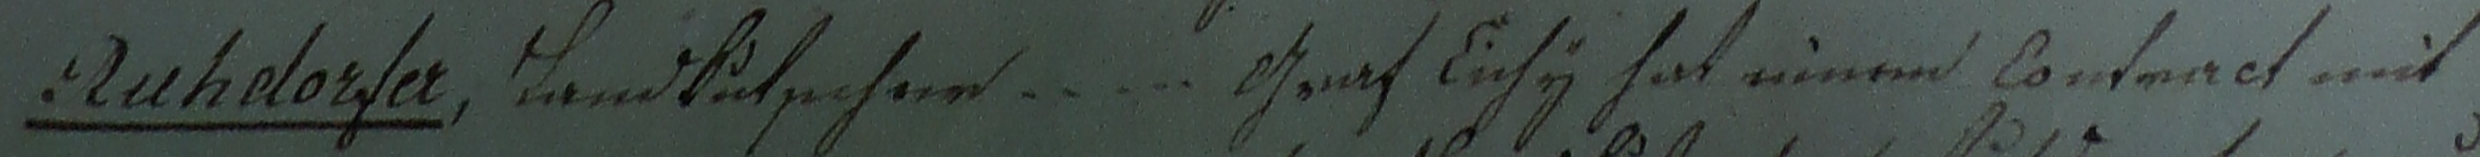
Ruhdorfer, Landkutscher ….. Graf Cichy hat einen Contract mit
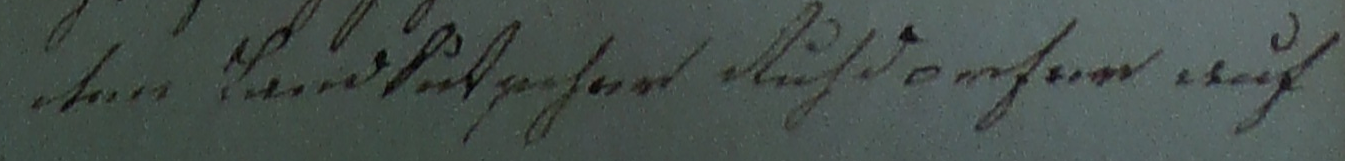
dem Landkutscher Ruhdorfer auf
